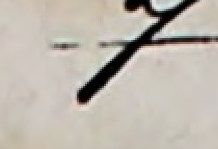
7
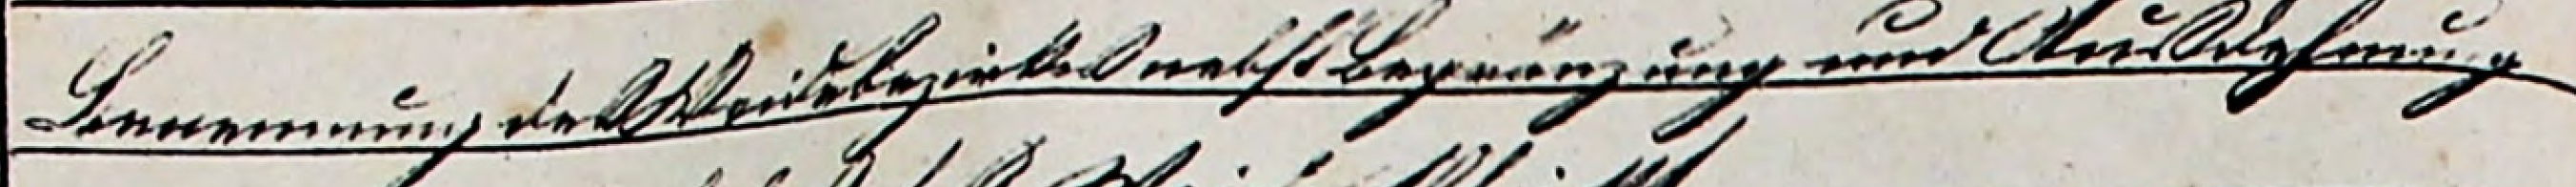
Benennung des Weidebezirkes nebst Begränzung und Ausdehnung
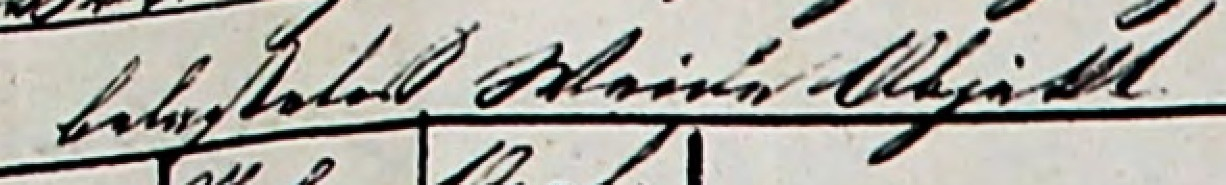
belastetes Weide Objekt.
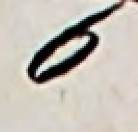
6
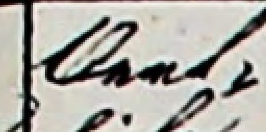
Oert„
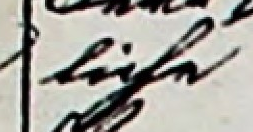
liche
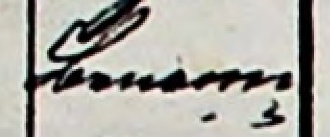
Benenn„
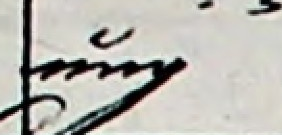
ung
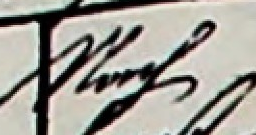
Noch
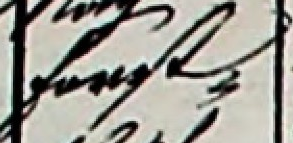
Forst„
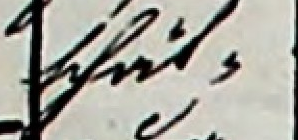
schät„
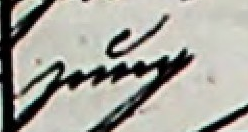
zung
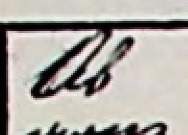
Ob
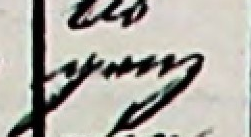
ganz
